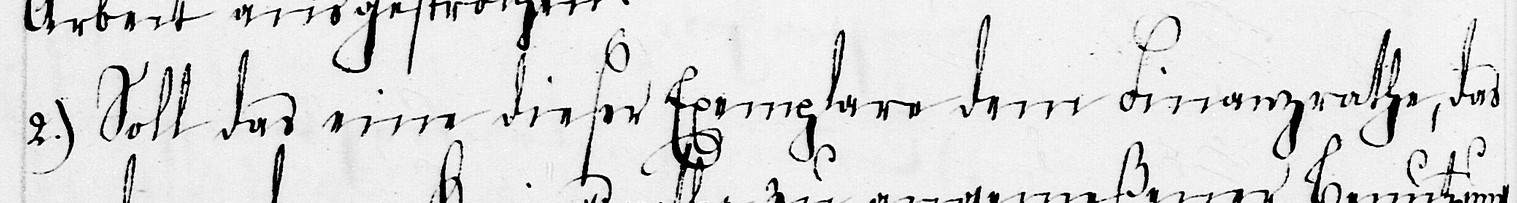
2.) Soll das eine dieser Exemplare dem Finanzrathe, das
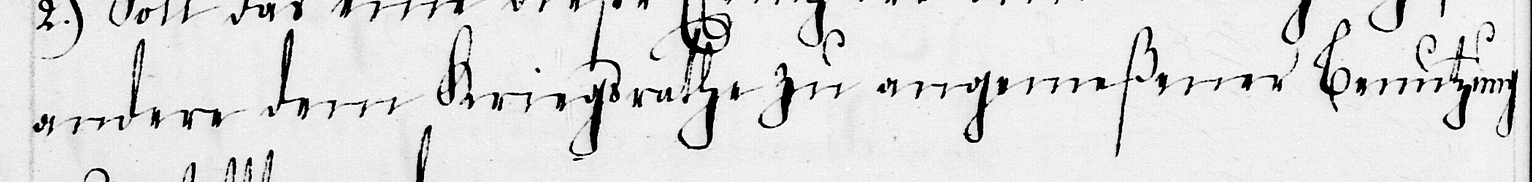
andere dem Kriegsrathe zu angemeßener Benutzung
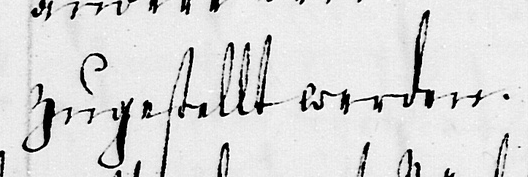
zugestellt werden.
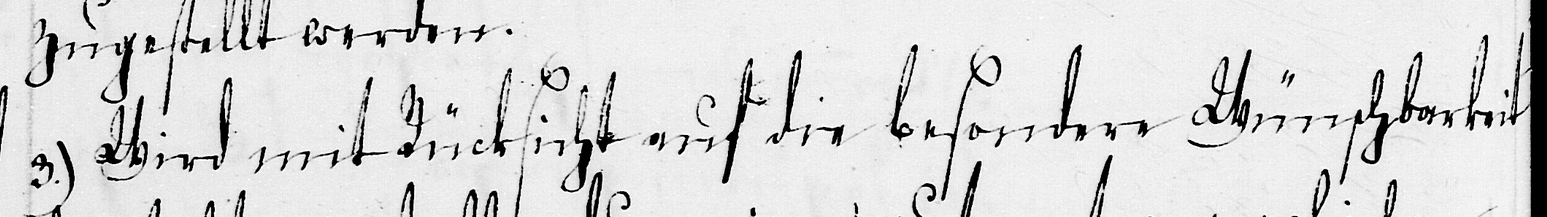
3.) Wird mit Rücksicht auf die besondere Wünschbarkeit
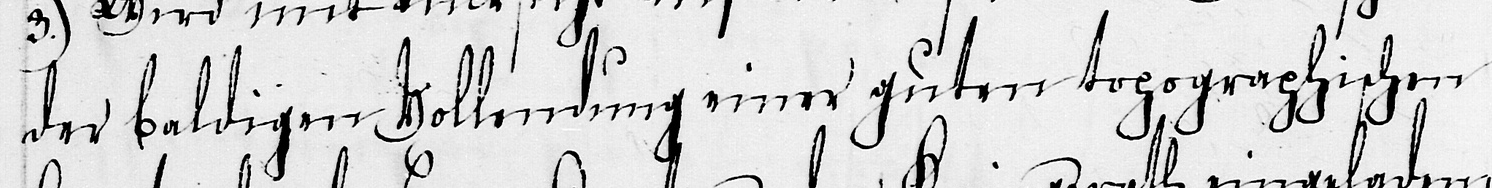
der baldigen Vollendung einer guten topographischen
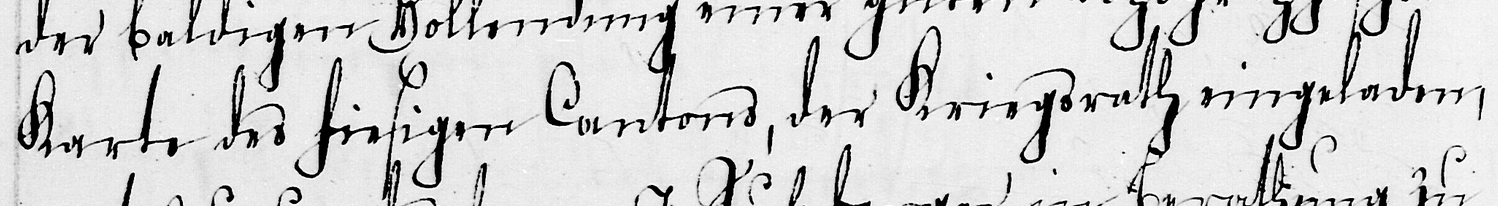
Karte des hiesigen Cantons, der Kriegsrath eingeladen,
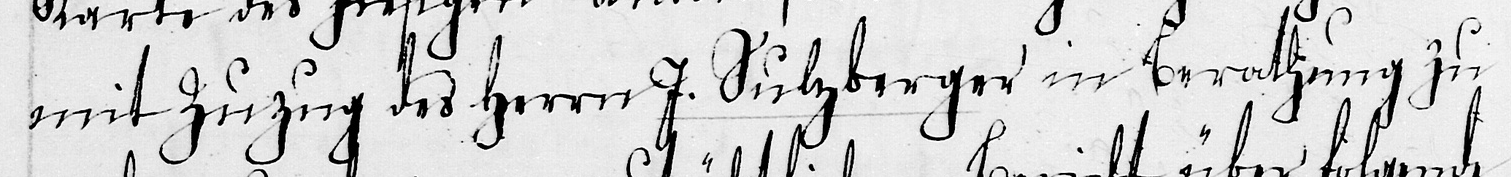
mit Zuzug des Herrn J. Sulzberger in Berathung zu
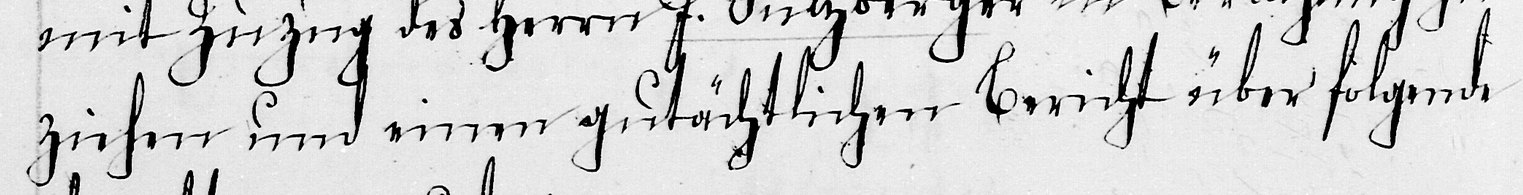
ziehen und einen gutächtlichen Bericht über folgende
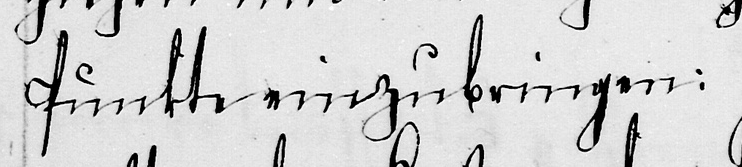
Punkte einzubringen:
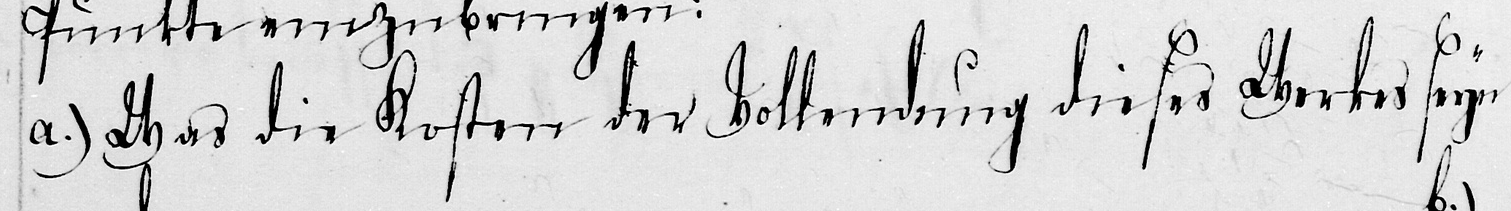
a.) Was die Kosten der Vollendung dieses Werkes seyn
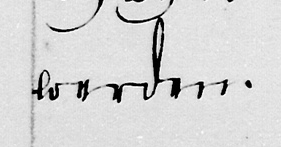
werden.
